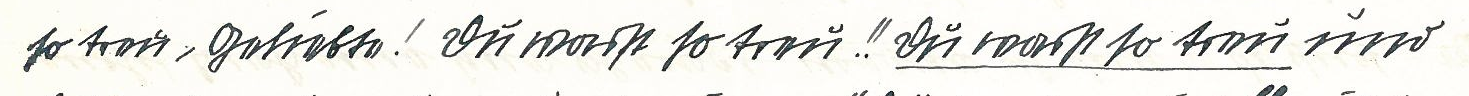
so treu, Geliebte! Du warst so treu!! Du warst so treu und
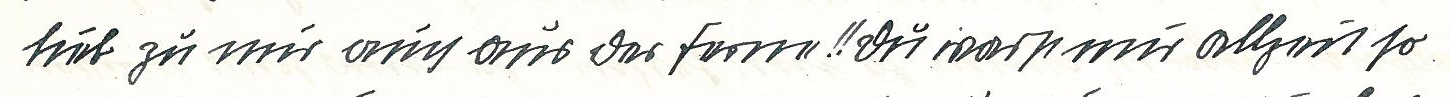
lieb zu mir auch aus der Ferne!! Du warst mir allzeit so
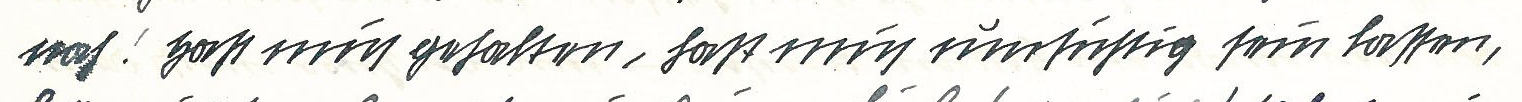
nah! Hast mich gehalten, hast mich umsichtig sein lassen,
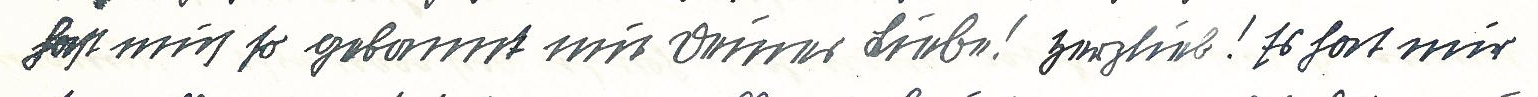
hast mich so gebannt mit Deiner Liebe! Herzlieb! Es hat mir
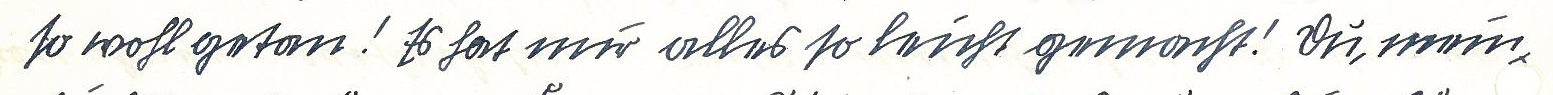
so wohl getan! Es hat mir alles so leicht gemacht! Du, mein
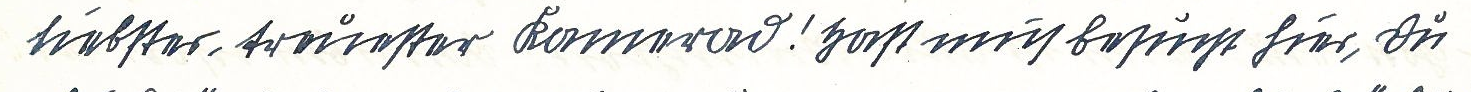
liebster, treuester Kamerad! Hast mich besucht hier, Du
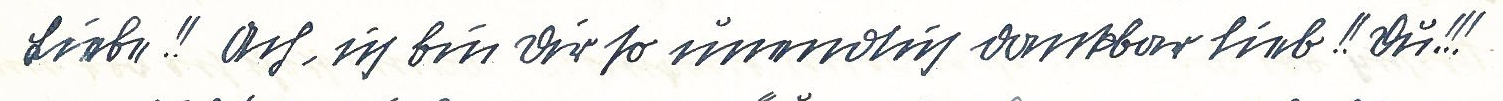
Liebe!! Ach, ich bin Dir so unendlich dankbar lieb!! Du!!!
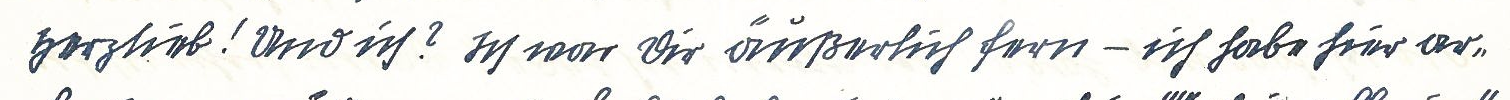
Herzlieb! Und ich? Ich war Dir äußerlich fern – ich habe hier ar¬
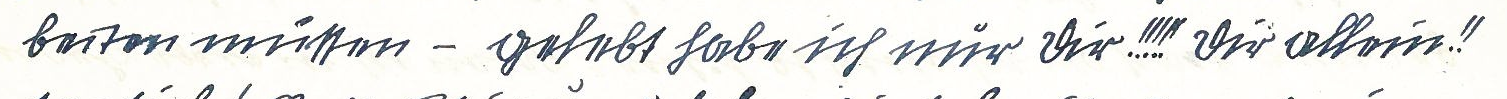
beiten müssen – gelebt habe ich nur Dir!!!!! Dir allein!!
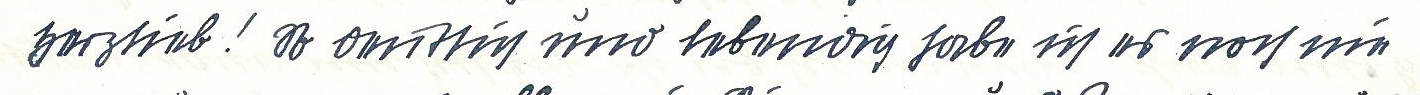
Herzlieb! So deutlich und lebendig habe ich es noch nie
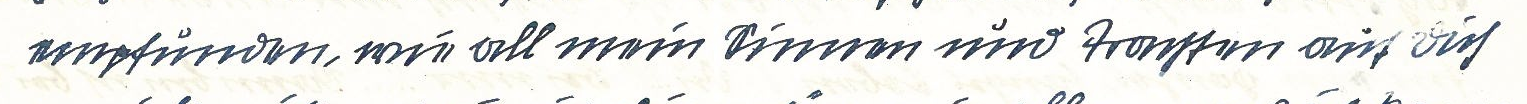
empfunden, wie all mein Sinnen und Trachten auf Dich
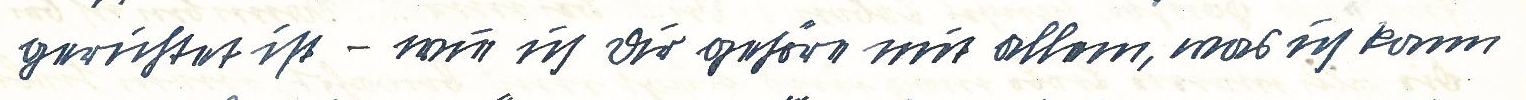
gerichtet ist – wie ich Dir gehöre mit allem, was ich kann
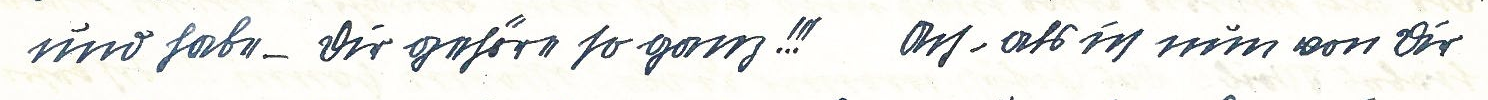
und habe – Dir gehöre so ganz!!! Ach; als ich nun von Dir
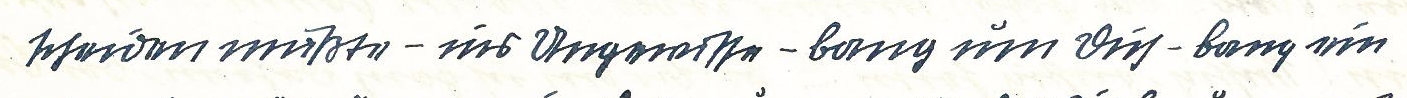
scheiden mußte – ins Ungewisse – bang um Dich – bang ein
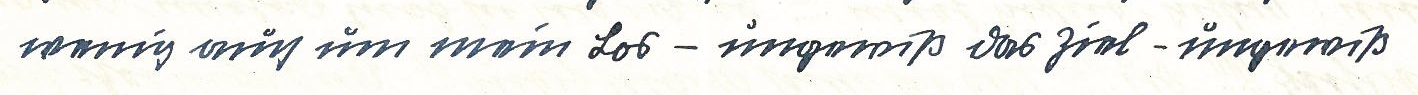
wenig auch um mein Los – ungewiß das Ziel – ungewiß
